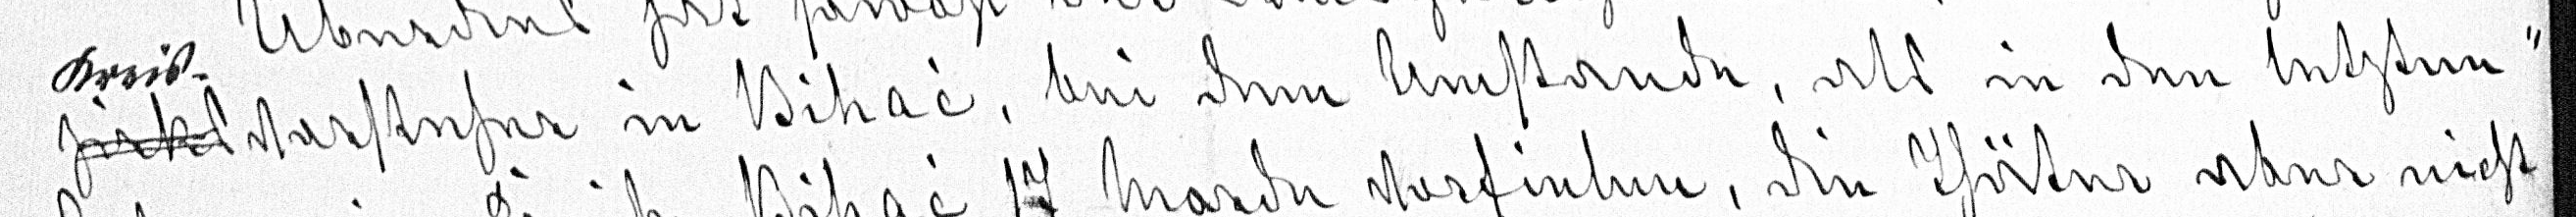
vorsteher in Bihać, bei dem Umstande, als in den letzten
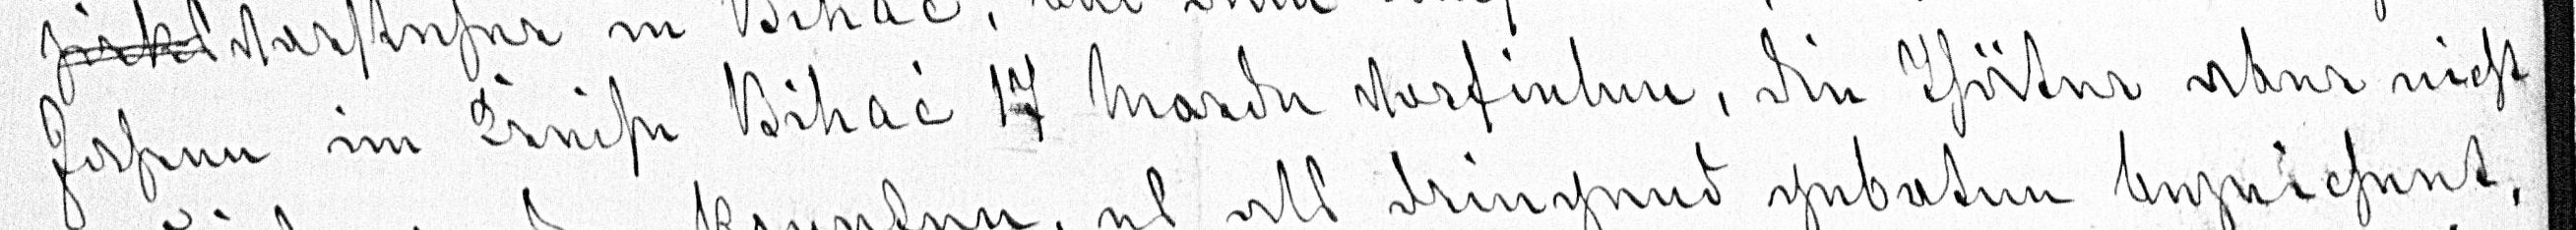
Jahren im Kreise Bihać 17 Morde vorfielen, die Thäter aber nicht
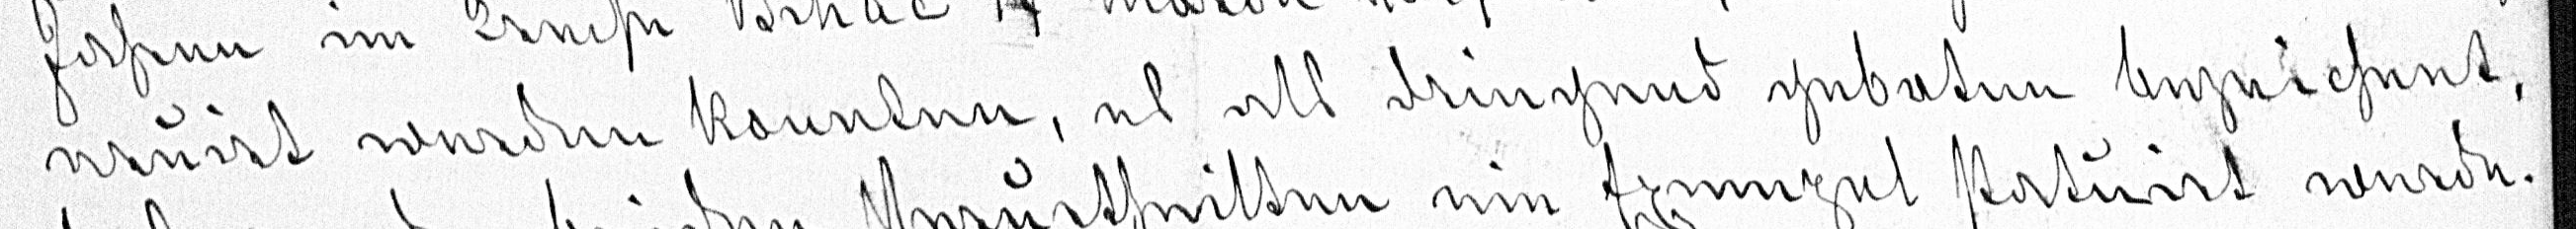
eruirt werdne konnten, es als dringend geboten bezeichnet,
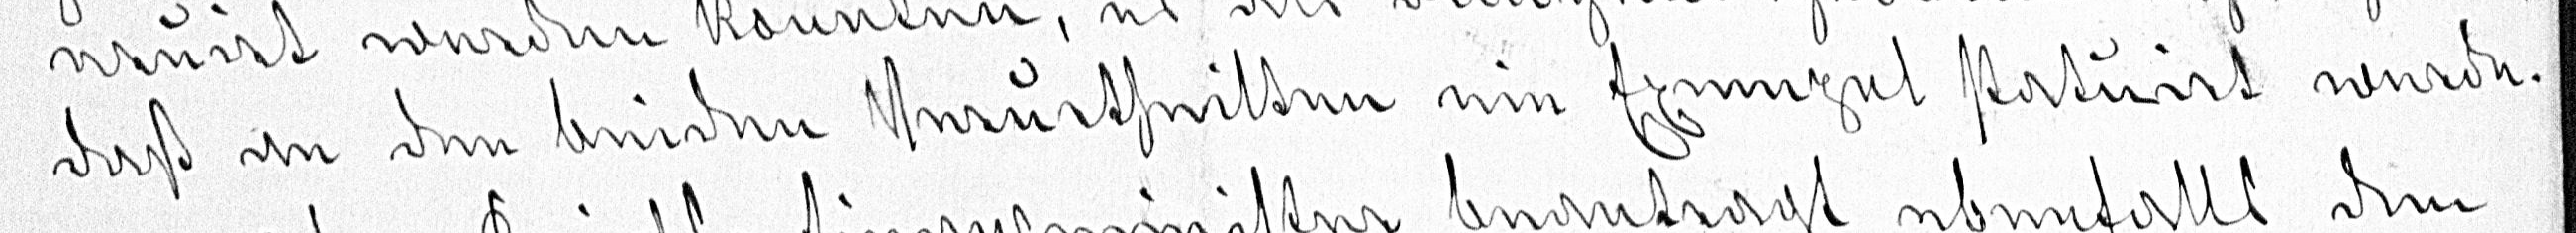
daß an den beiden Verurtheilten ein Exempel statuirt werde.
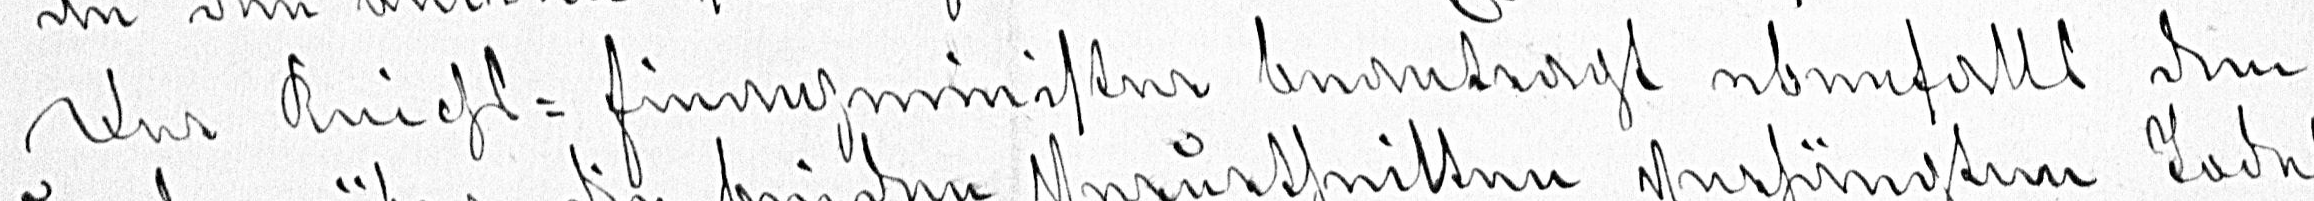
Der Reichs-Finanzminister beantragt ebenfalls den
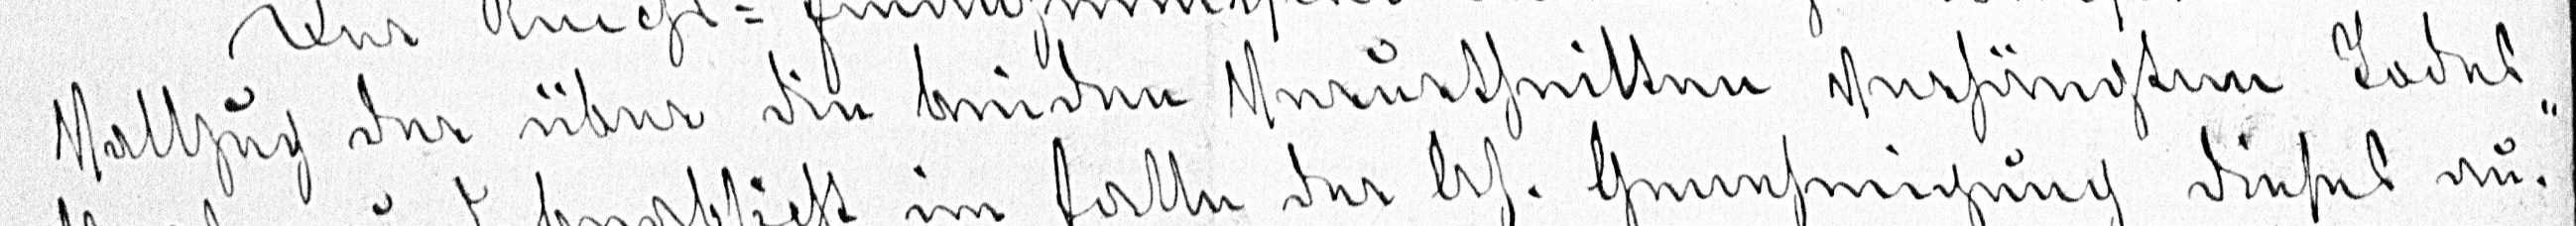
Vollzug der über die beiden Verurtheilten verhängten Todes¬
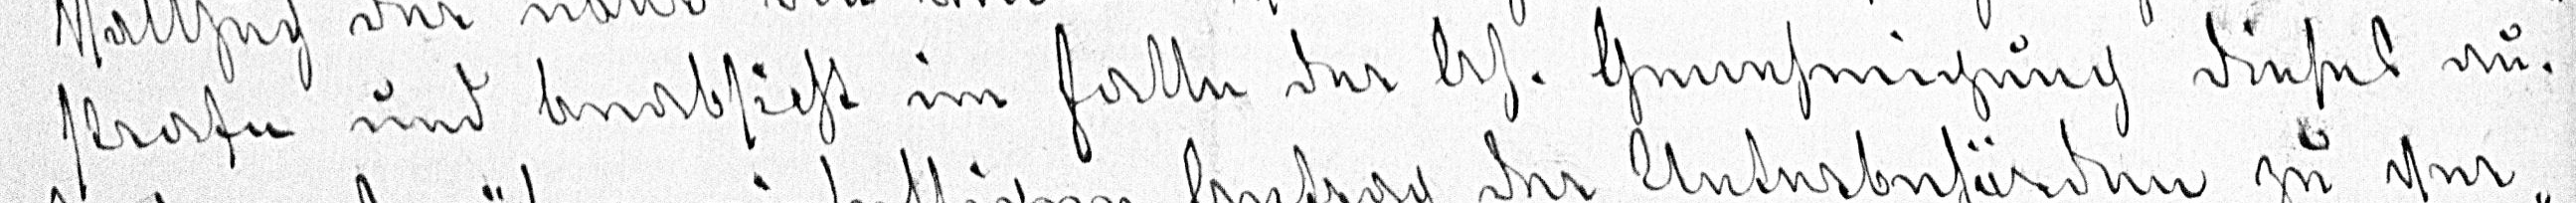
strafe und beabsicht im Falle der Az. Genehmigung dieses au.
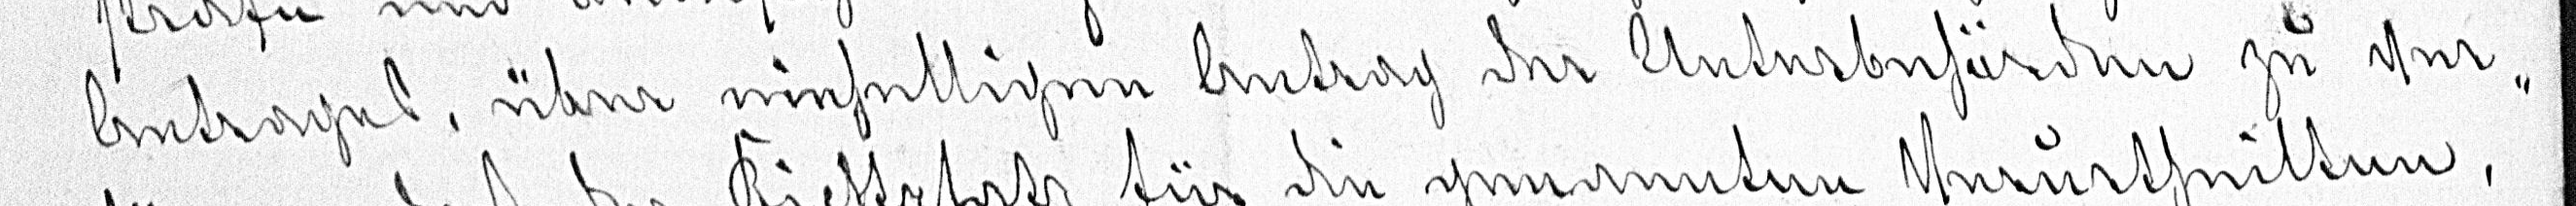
Antrages, über einhelligen Antrag der Unterbehörden zu ver¬
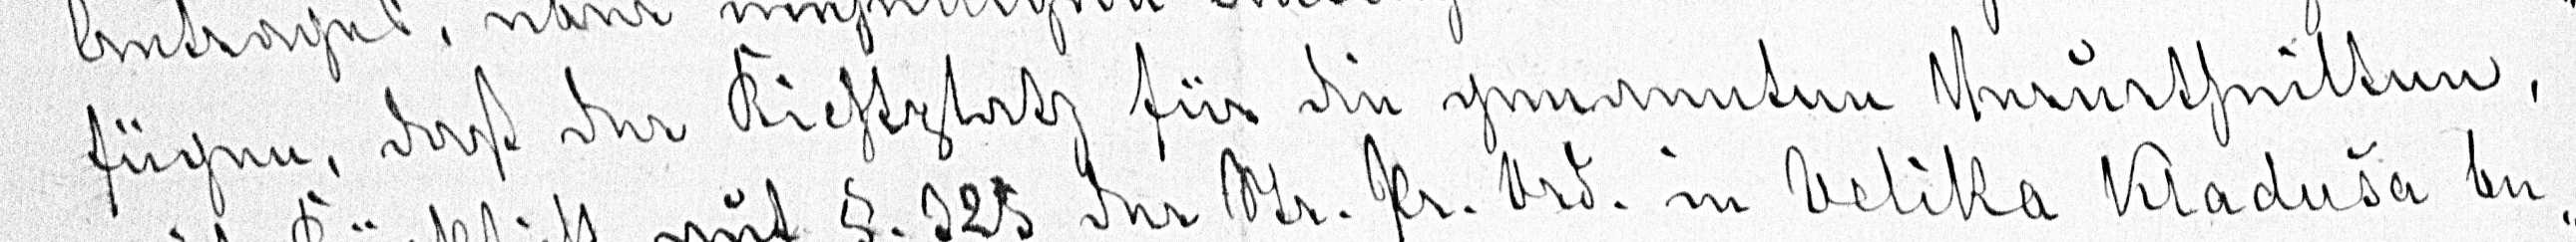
fügen, daß der Richtpfalz für die genannten Verurtheilten,
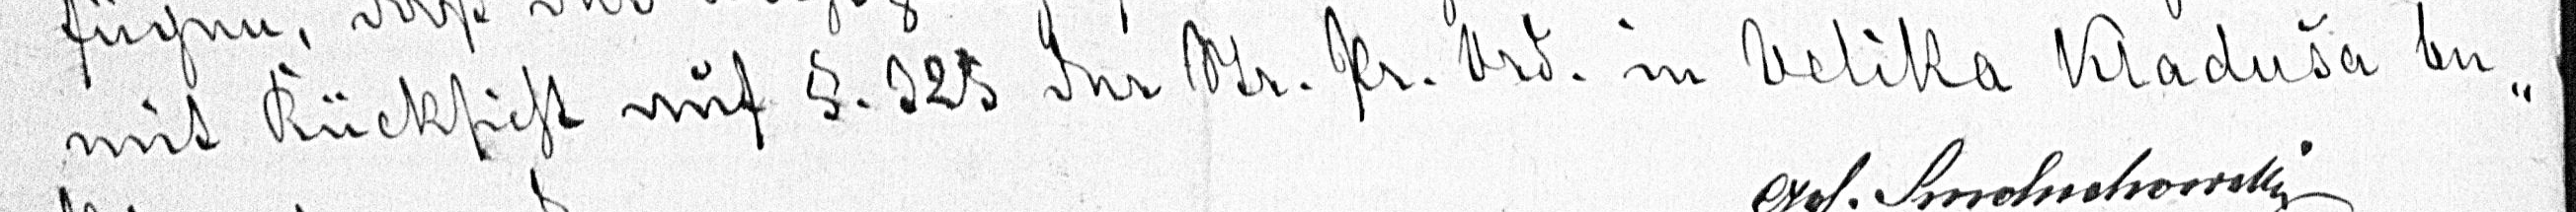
mit Rücksicht auf §. 325 der Str. Pr. Ord. in Velika Kladuša be¬
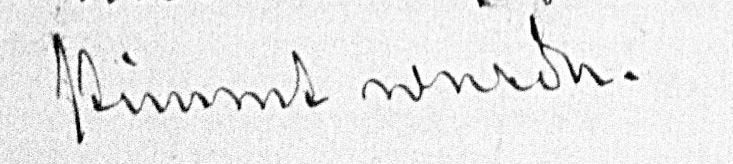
stimmt werde.
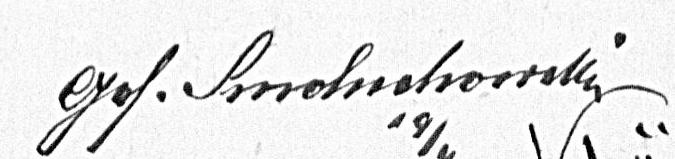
Ges. Smolnchowski
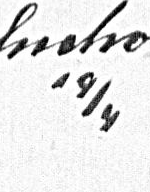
19/4
